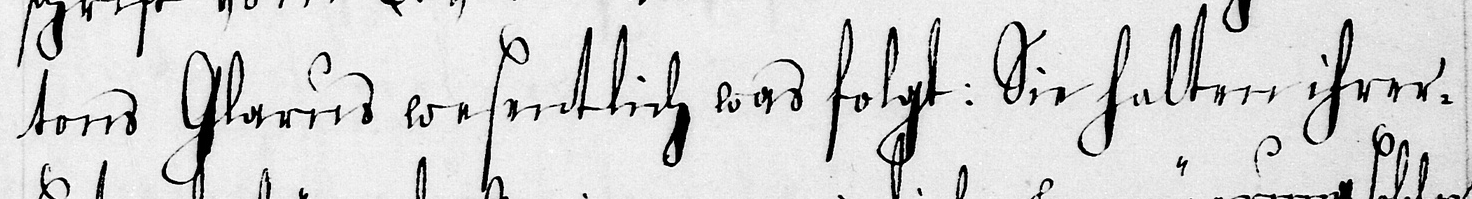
tons Glarus wesentlich was folgt: Sie halten ihrer¬
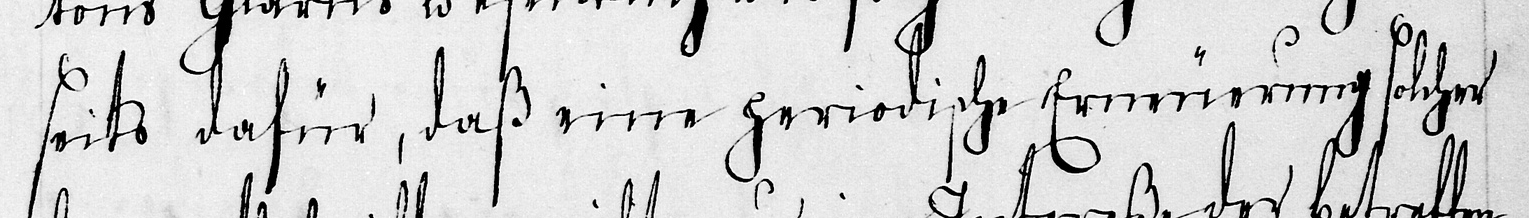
seits dafür, daß eine periodische Erneuerung solcher
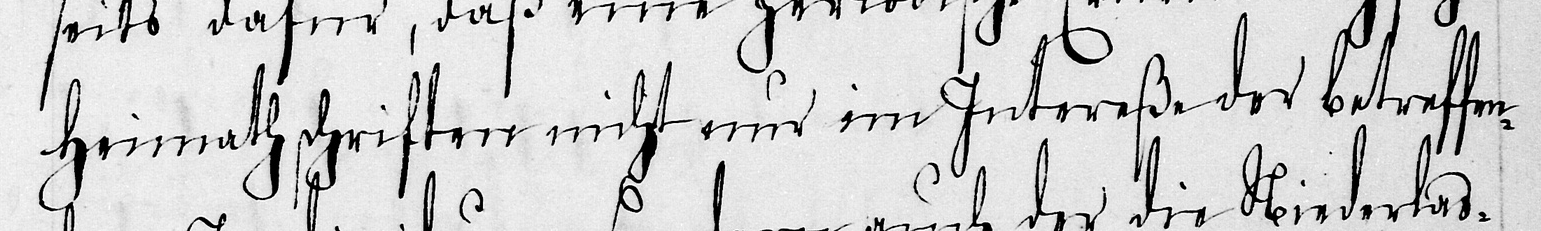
Heimathschriften nicht nur im Intereße der betreffe¬
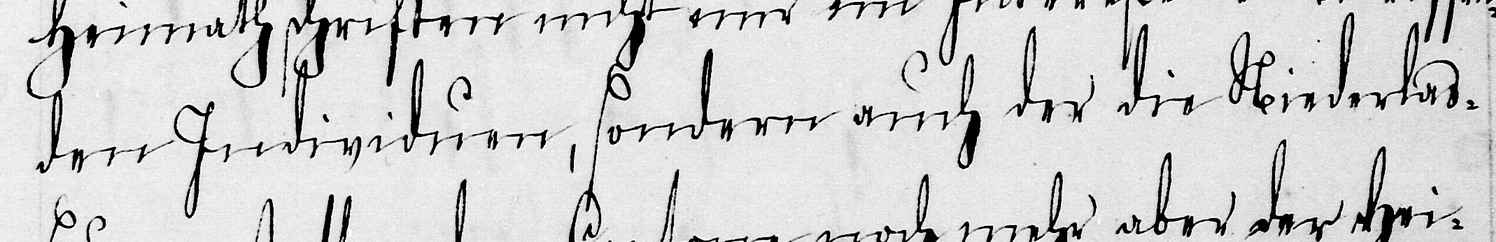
nden Individuen, sondern auch der die Niederlaß¬
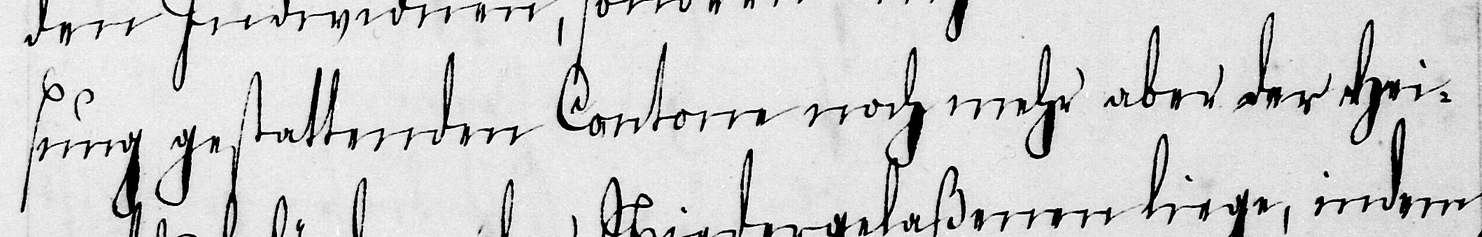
ung gestattenden Cantone noch mehr aber der Hei¬
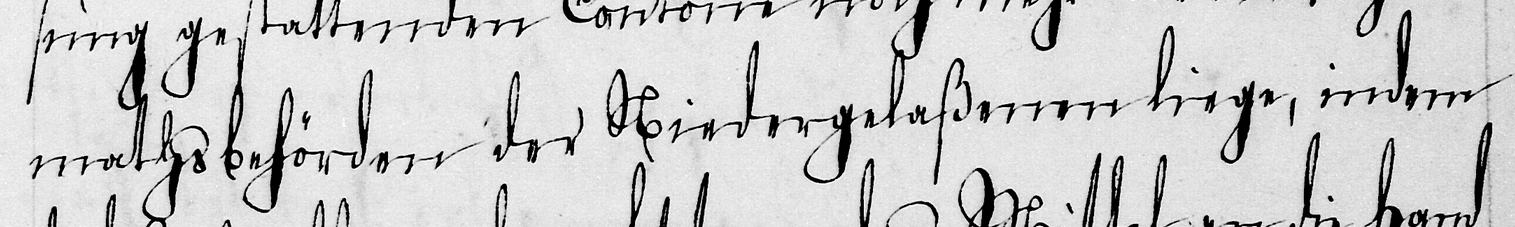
mathsbehörden der Niedergelaßenen liege, indem
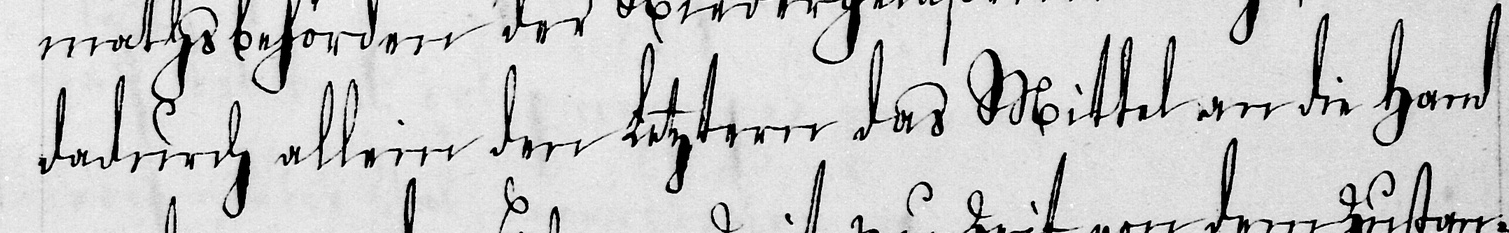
dadurch allein den Letztern das Mittel an die Hand
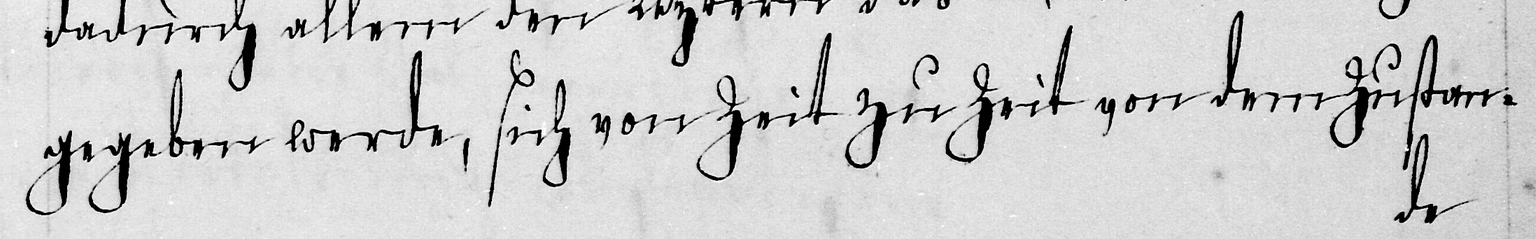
gegeben werde, sich von Zeit zu Zeit von dem Zustan-
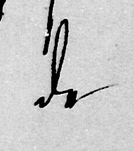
der
